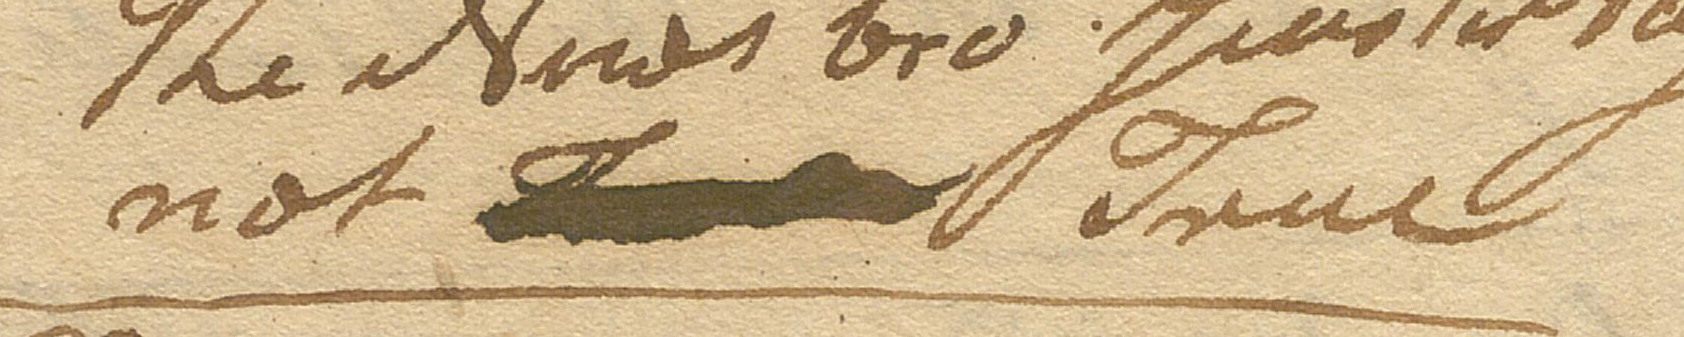not [____] True
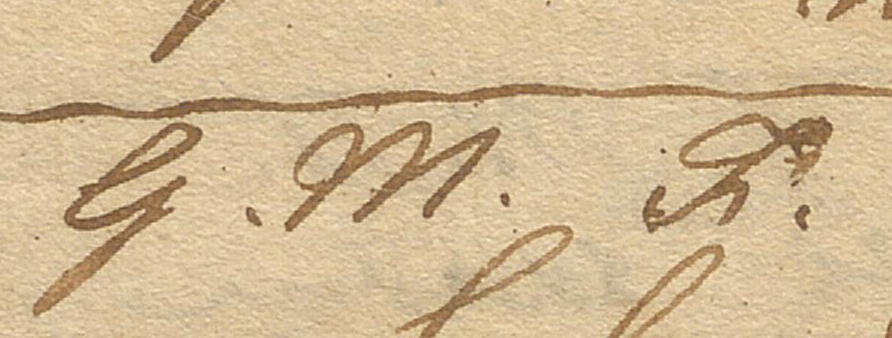G. M. F.
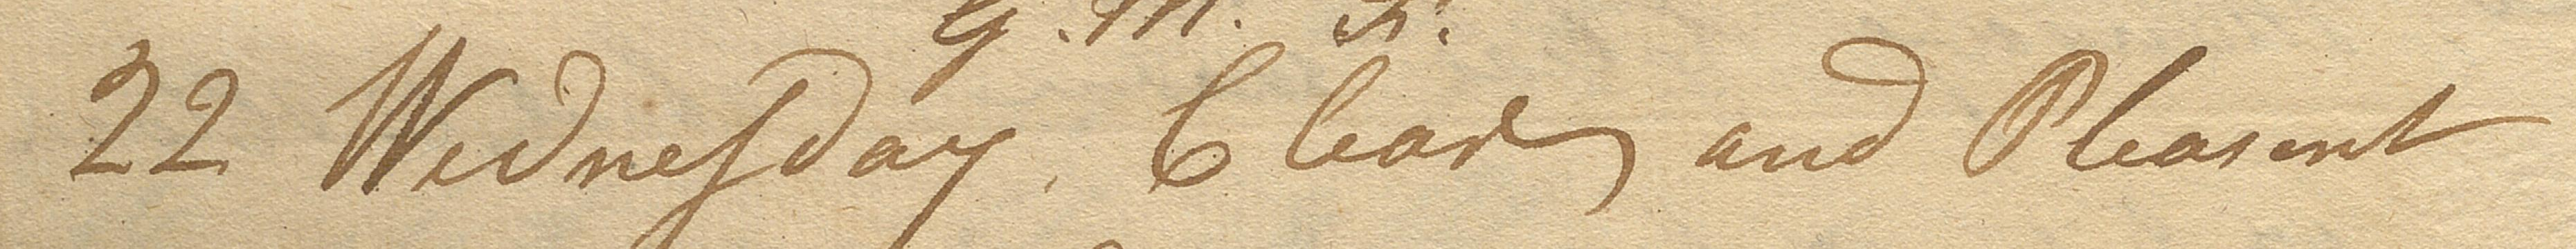22 Wednesday. Clear and Pleasent
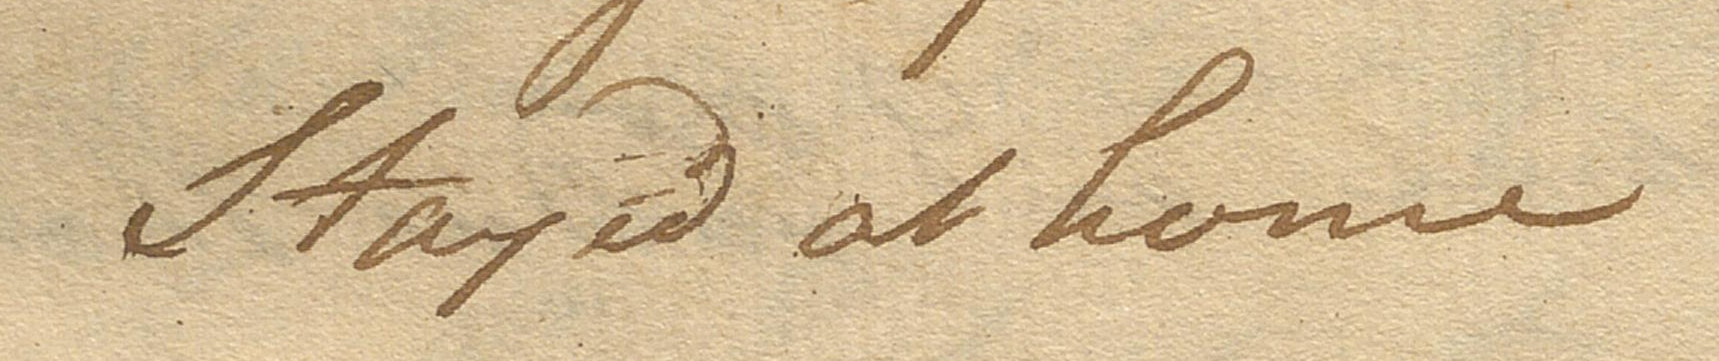Stayed at home
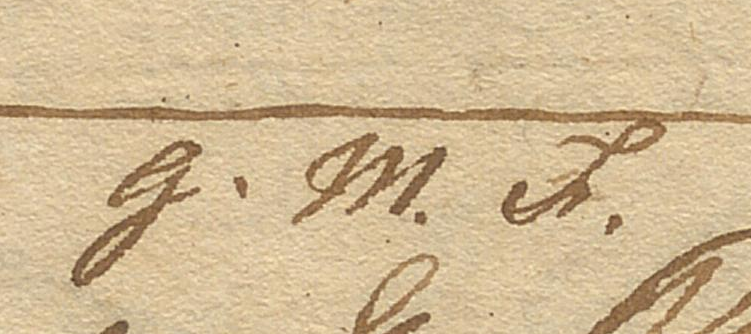G. M. F.
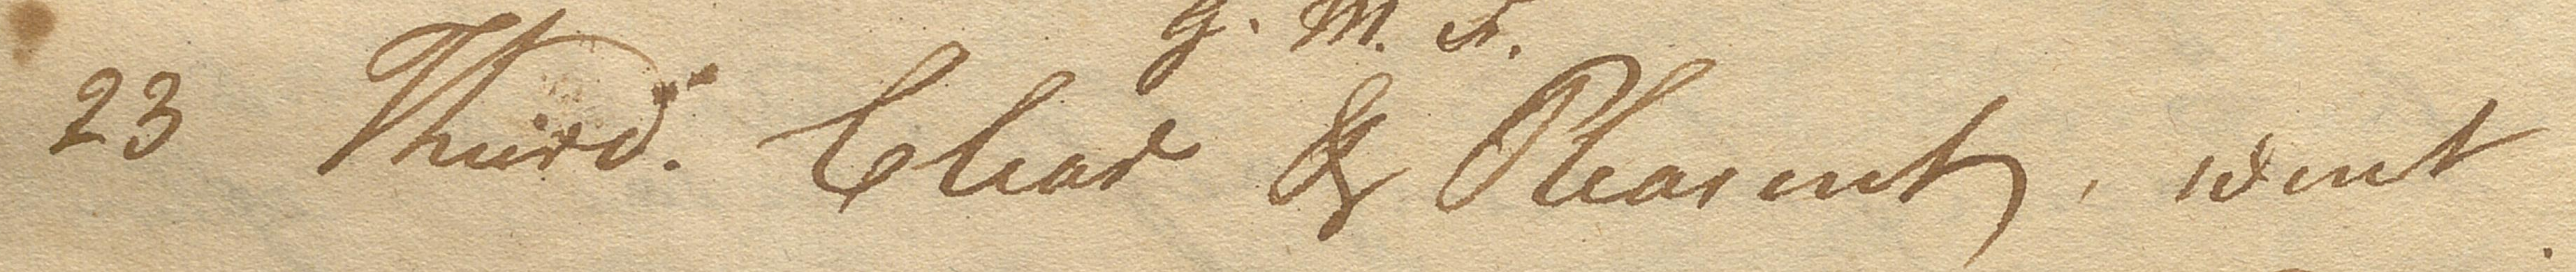23 Thurd. Clear & Pleasent, went
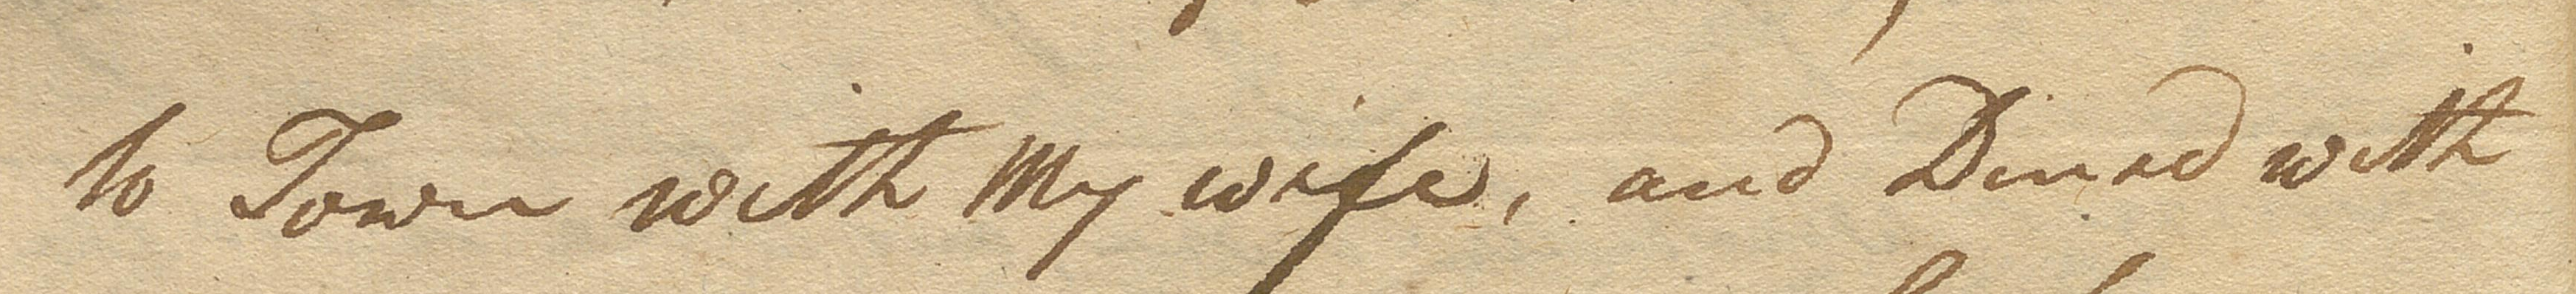to Town with My wife, and Dined with
